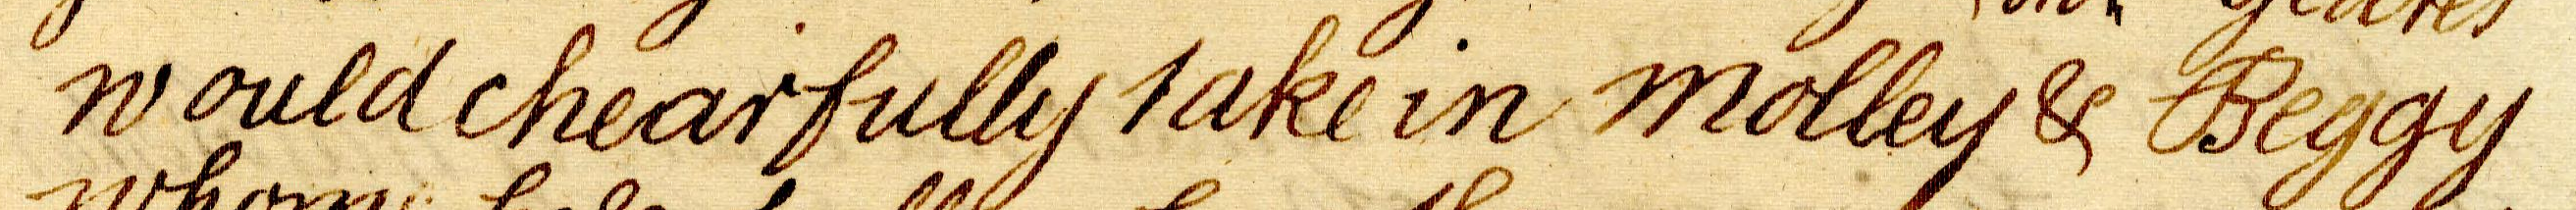would chearfully take in Molley & Peggy
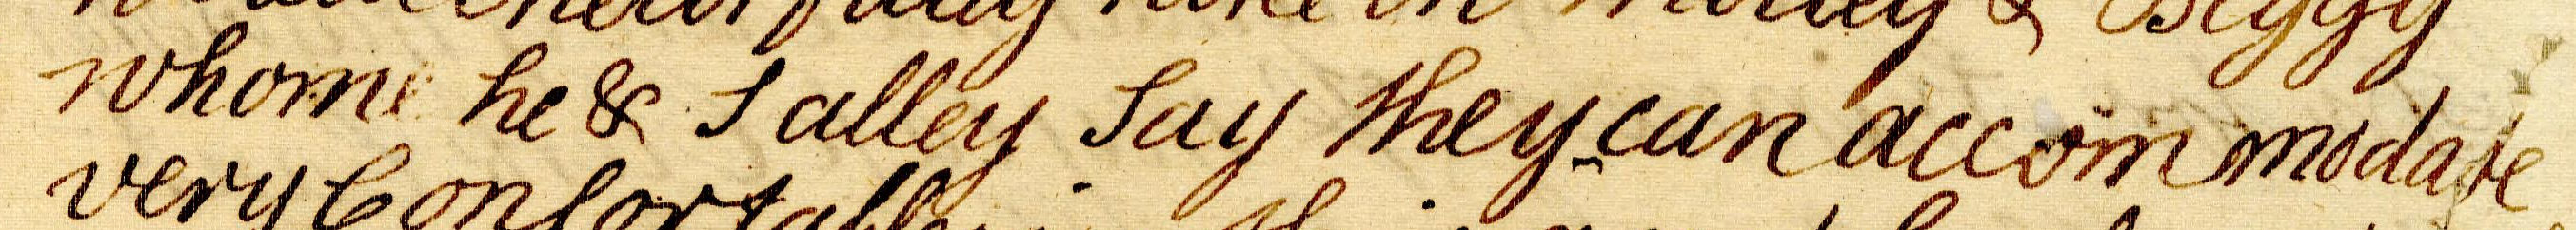whom he & Salley Say they can accommodate
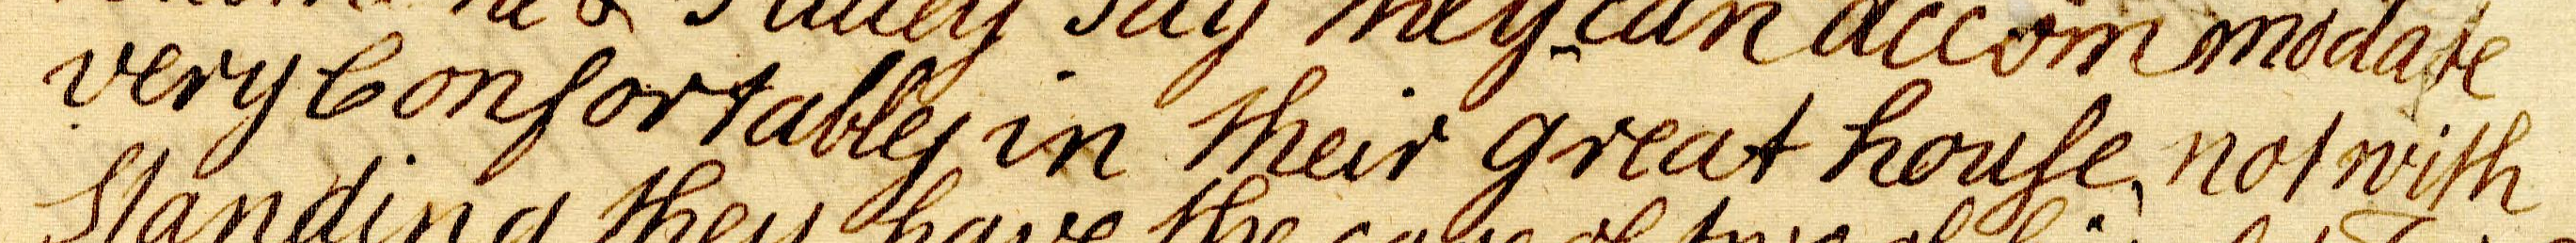very Confortably in their great house, not with
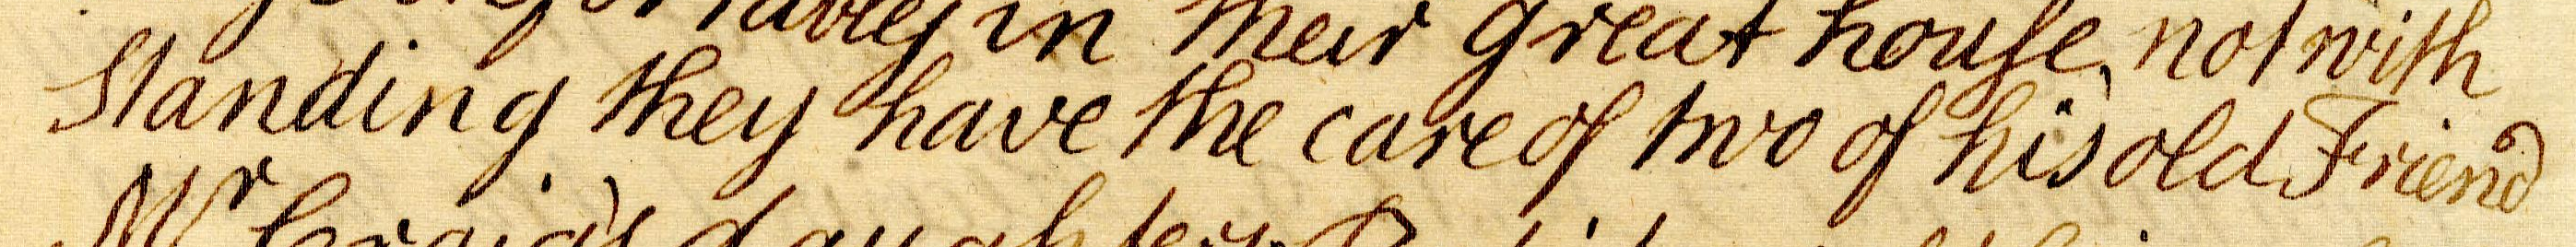standing they have the care of two of his old Friend
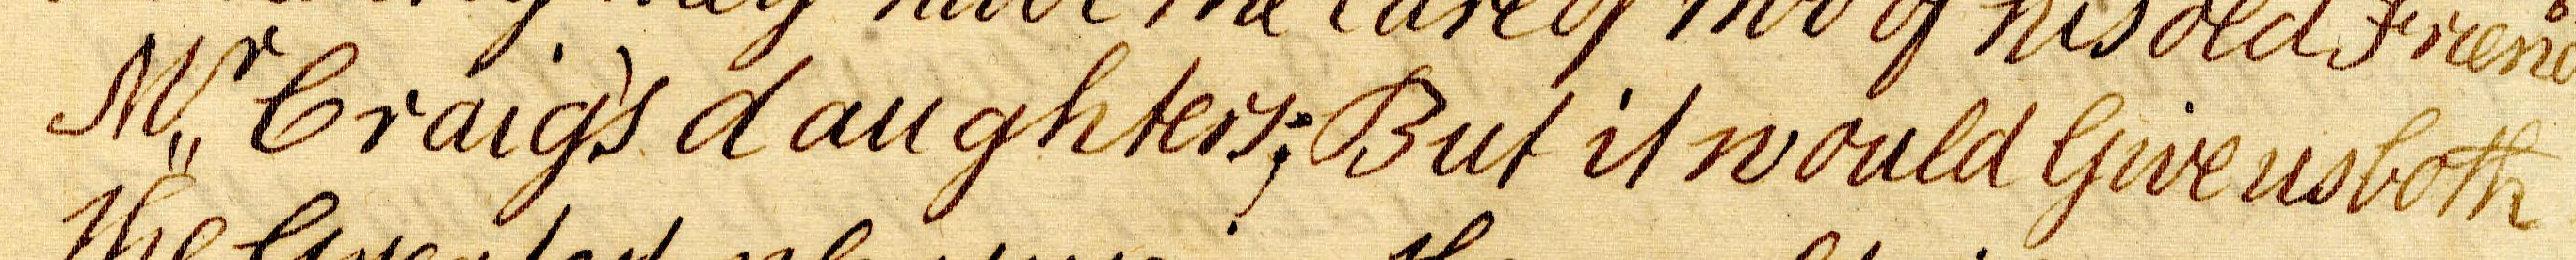M^r. Craig's daughters; But it would Give us both
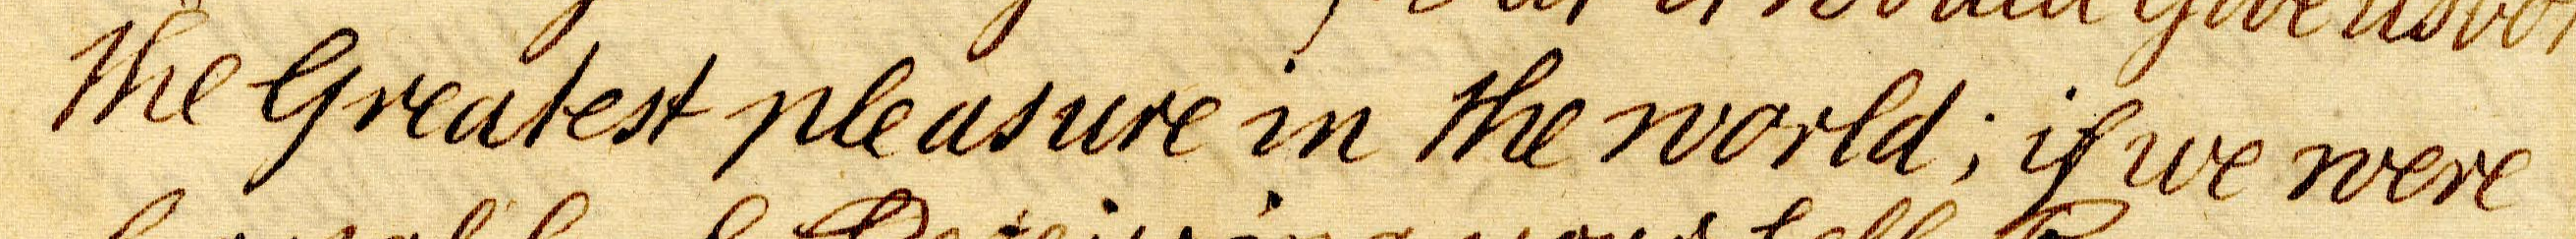the Greatest pleasure in the world; if we were
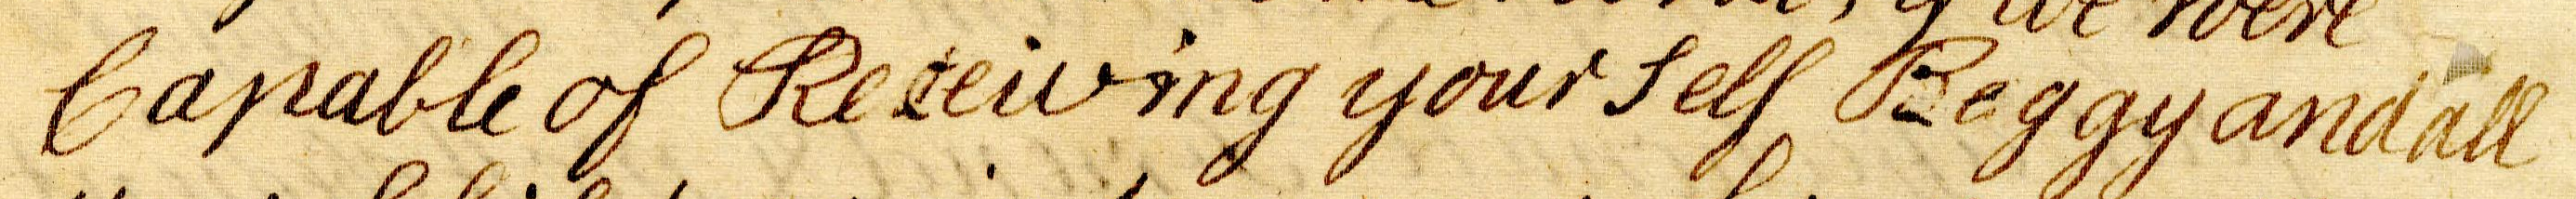Capable of Receiving your self Peggy and all
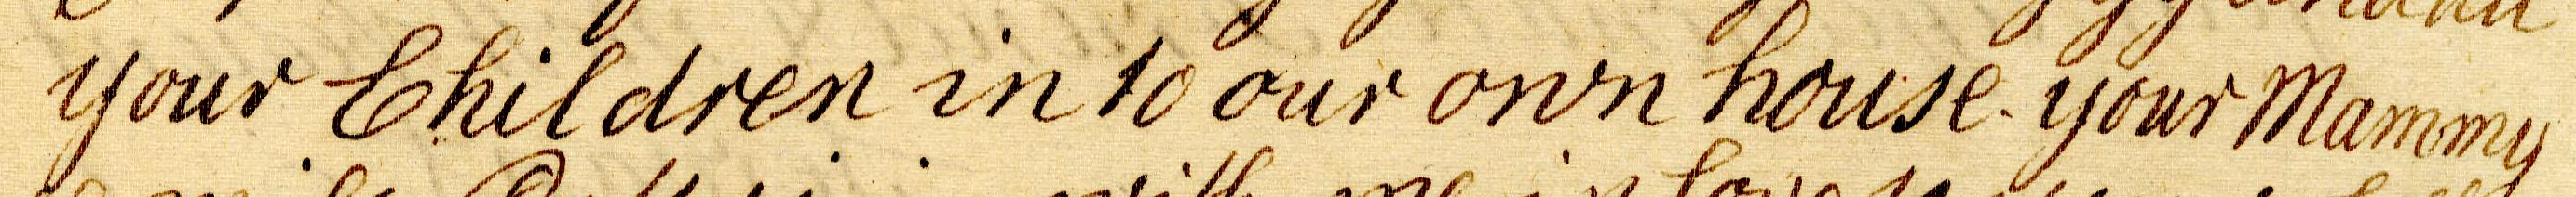Your Children in to our own house your Mammy
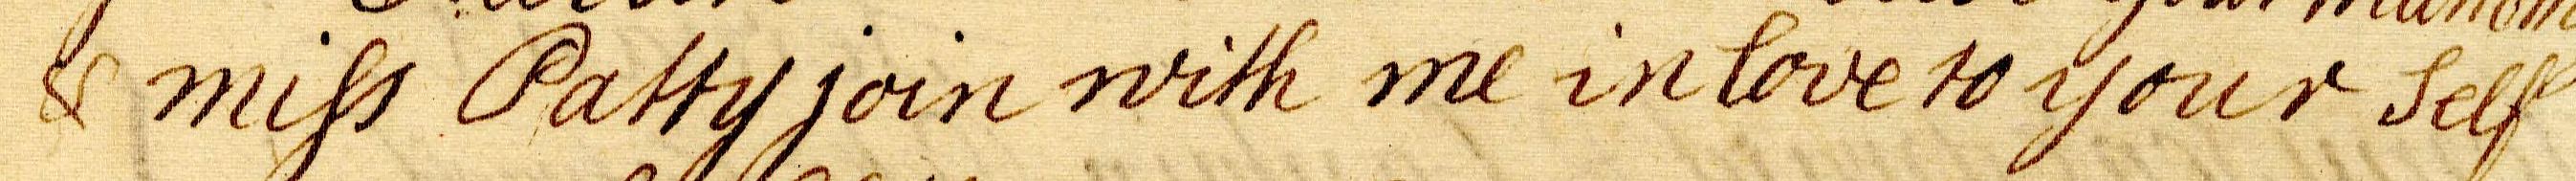& Miss Patty join with me in love to your Self
